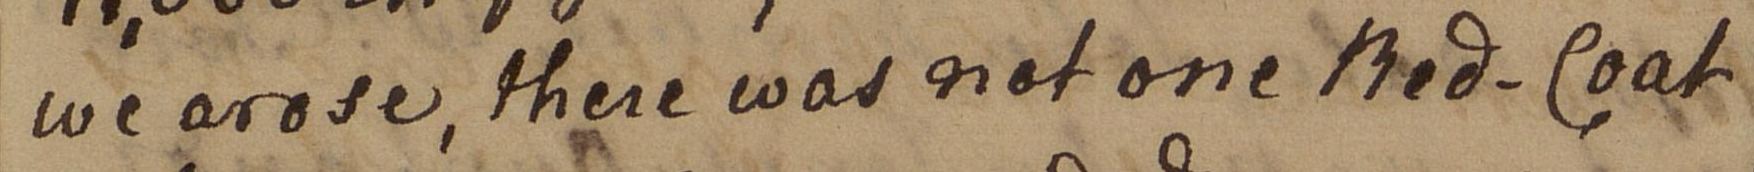we arose, there was not one Red- Coat
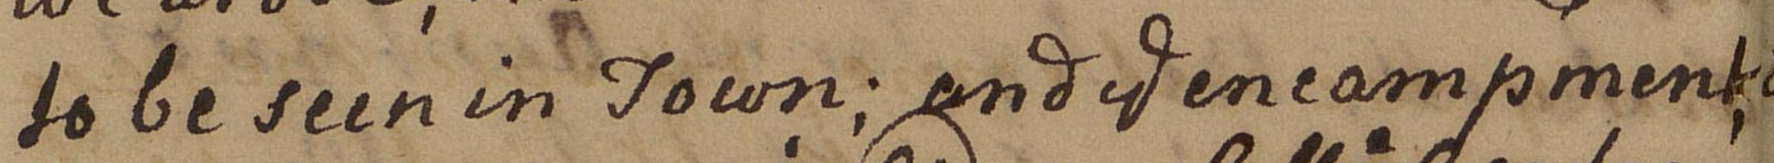to be seen in Town; and y^e encampment,
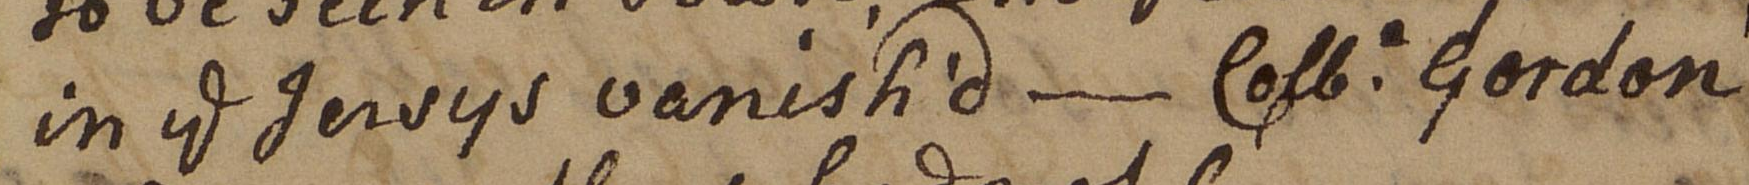in y^e Jersys vanish'd- Coll^l. Gordan
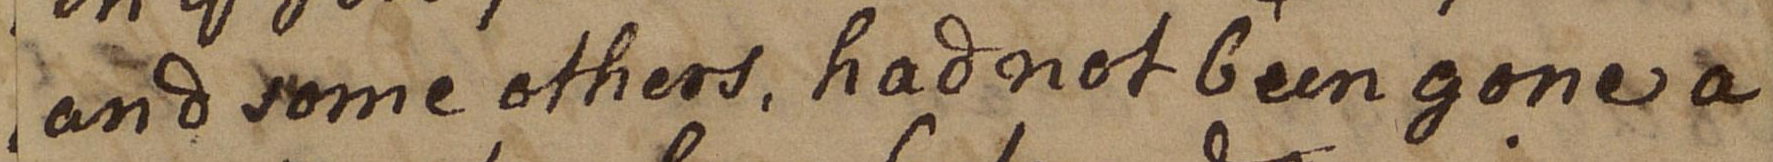and some others, had not been gone a
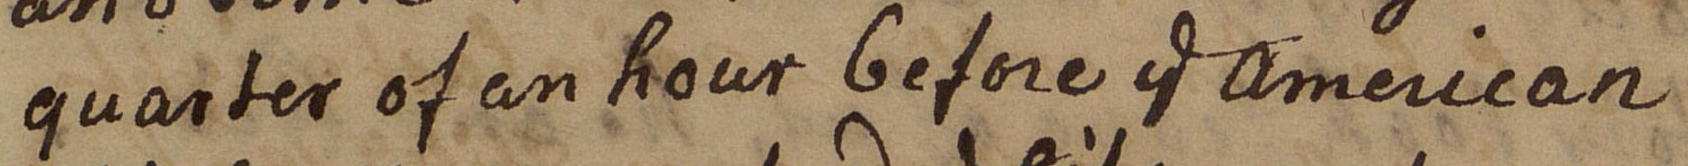quarter of an hour before y^e American
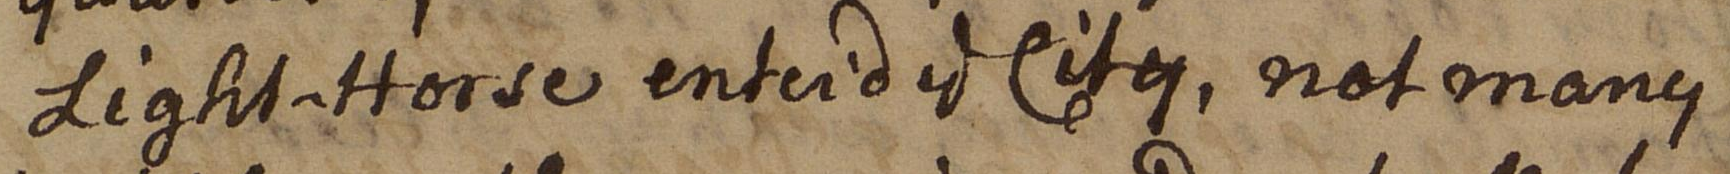Light-Horse enter'd y^e City, not many
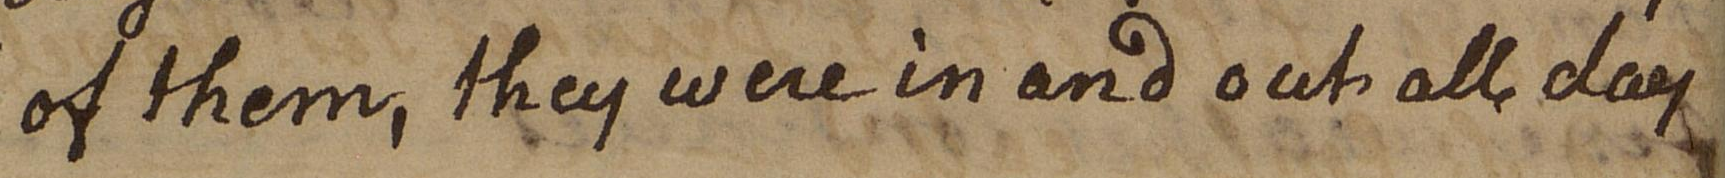of them, they were in and out all day
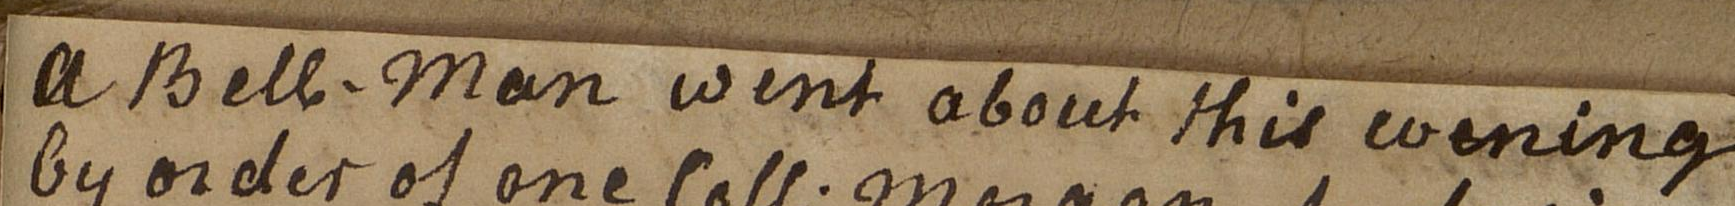A Bell-Man went about this evening
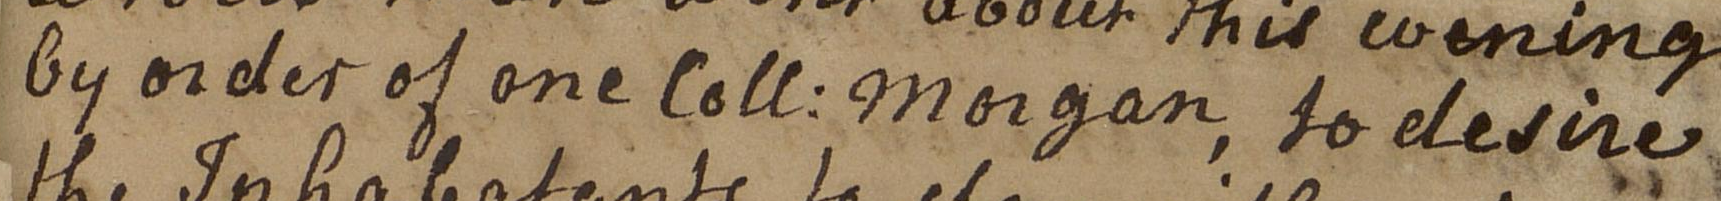by order of one Coll: Morgan, to desire
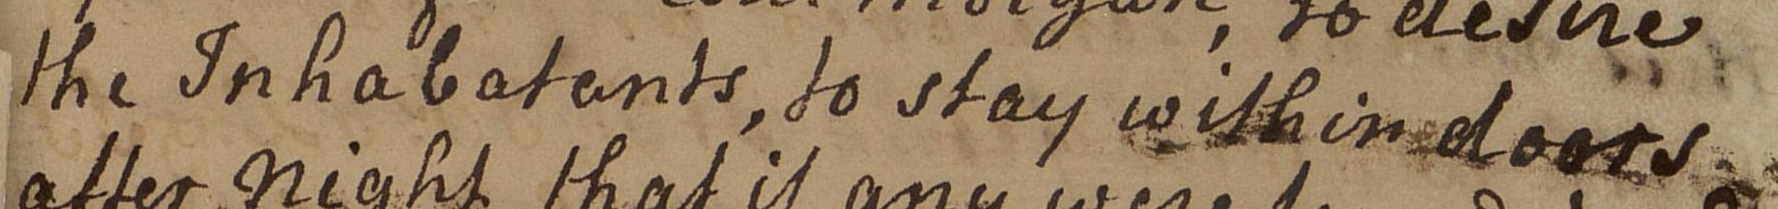the Inhabatants, to stay within doors.
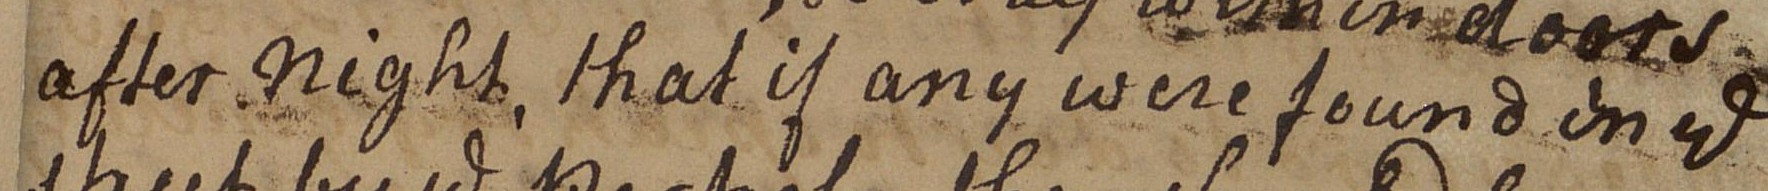after Night, that if any were found in y^e
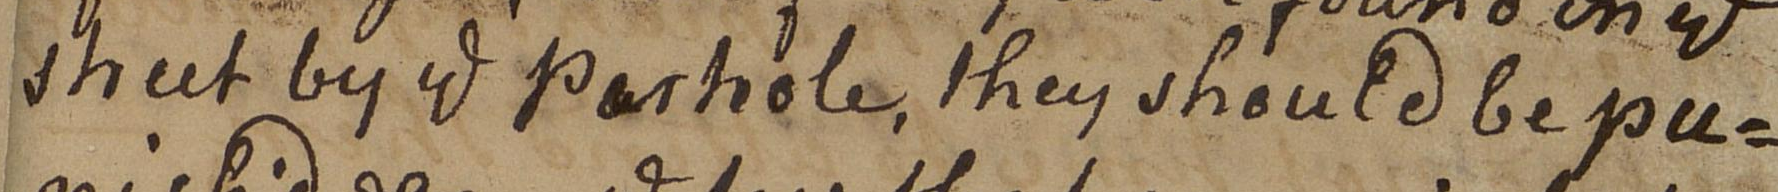street by y^e Partrole, they should be pu-
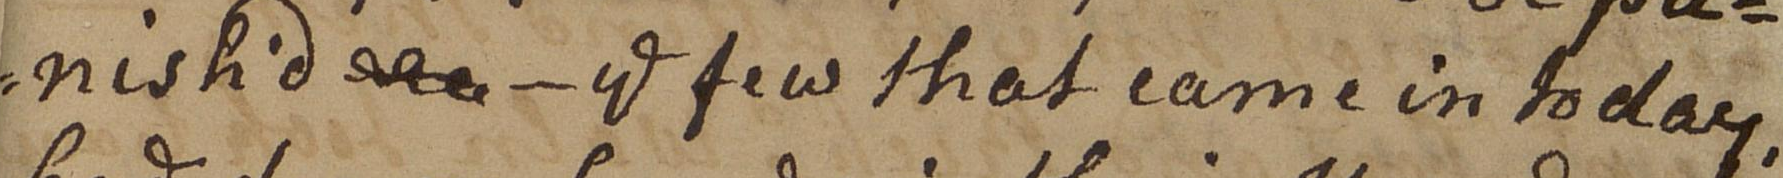-nish'd &c- y^e few that came in to day,
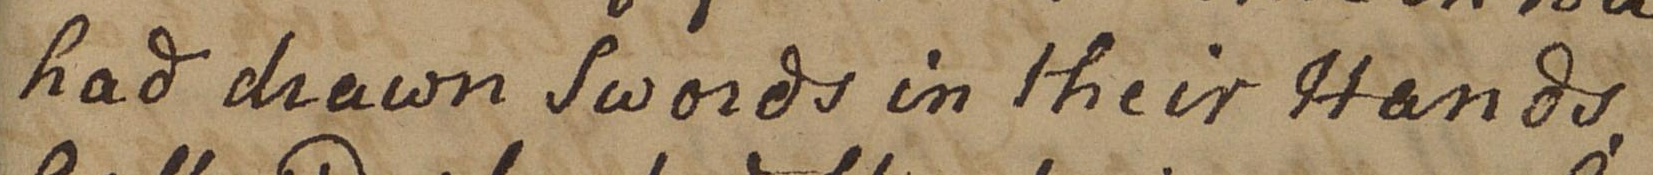had drawn Swords in their Hands.
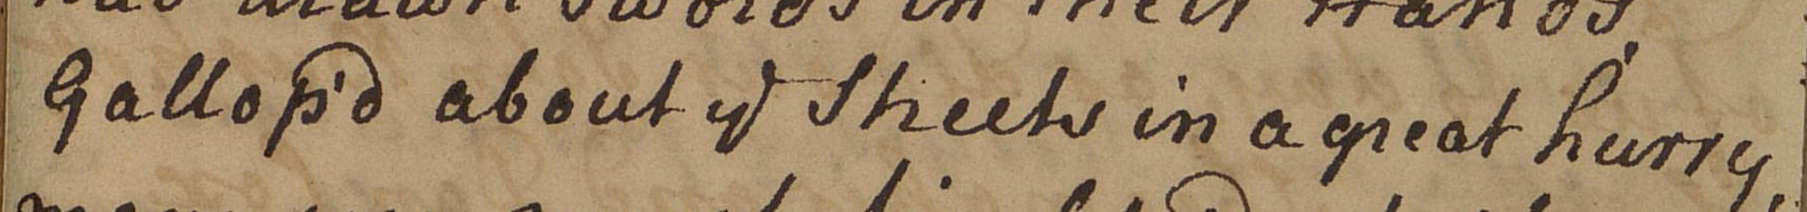Gallop'd about y^e Streets in a great hurry,
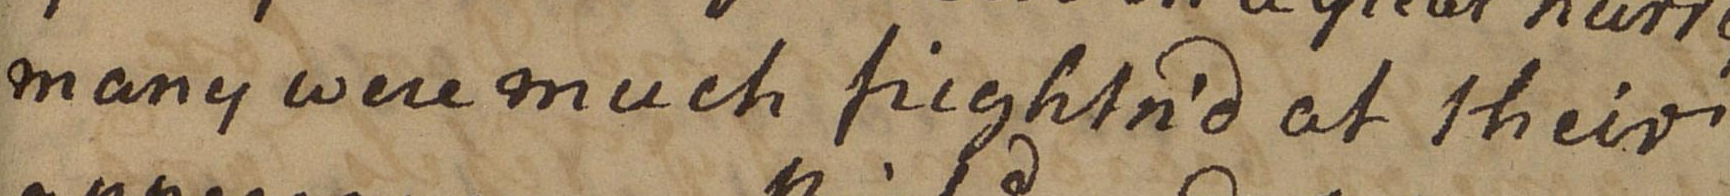nany were much frightn'd at their
